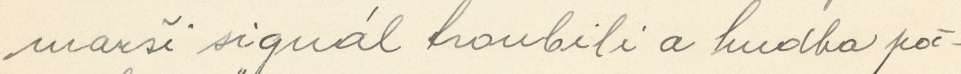marši signál troubili a hudba poč-
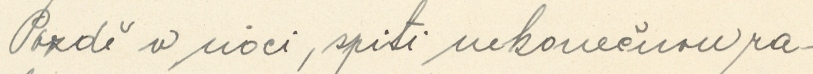Pozdě v noci, spiti nekonečnou ra-
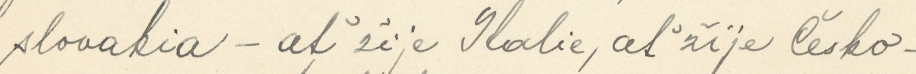slovakia - ať žije Italie, ať žije Česko-
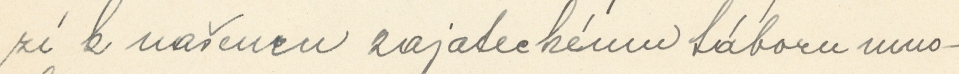zí k našemu zajateckému táboru mno-
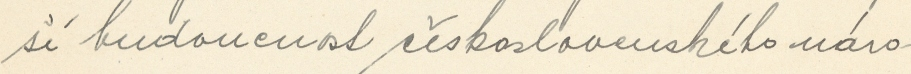ší budoucnost československého náro-
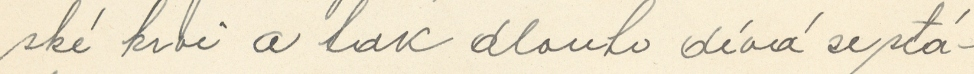ské krvi a tak dlouho dívá se stá-
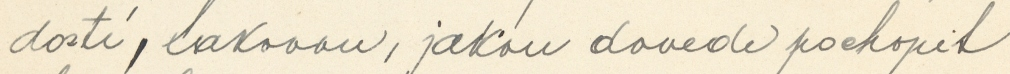dostí, takovou, jakou dovede pochopit
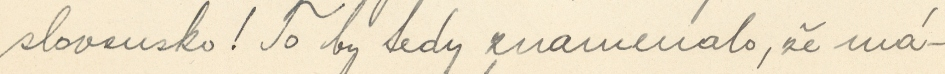slovensko! To by tedy znamenalo, že má-
